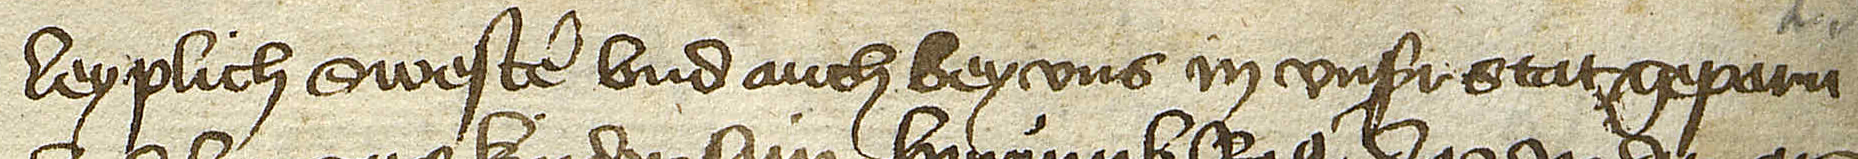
leyplich Sweſte* vnd auch bey vns in vnſ*r Stat geporn
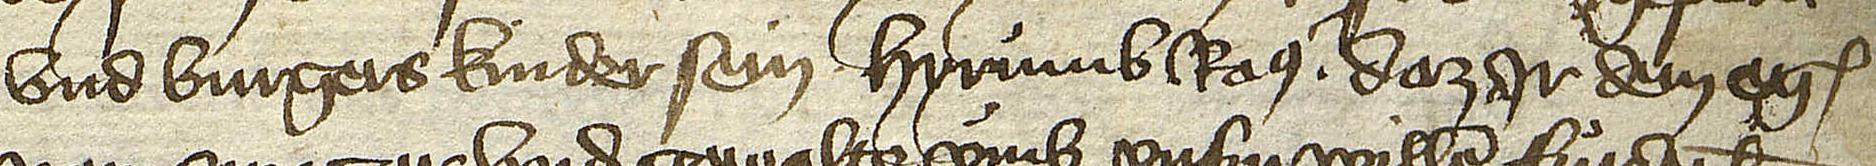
vnd burgers kinder ſein Hyrümb Ro* . daʒ Ir dem eg*
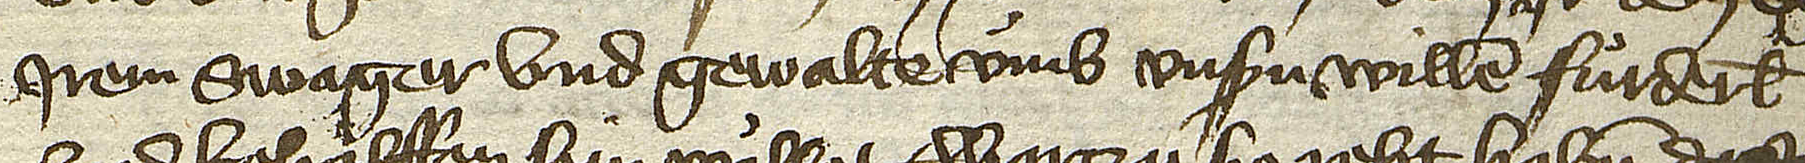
Irem Swager vnd gewalte v̈mb vnſ*n wille* fürderl*
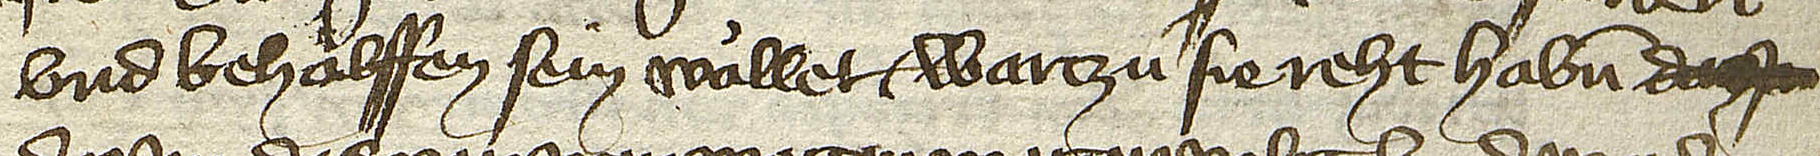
vnd beholffen ſein wöllet / warcʒu ſie reht hab*n daʒ In
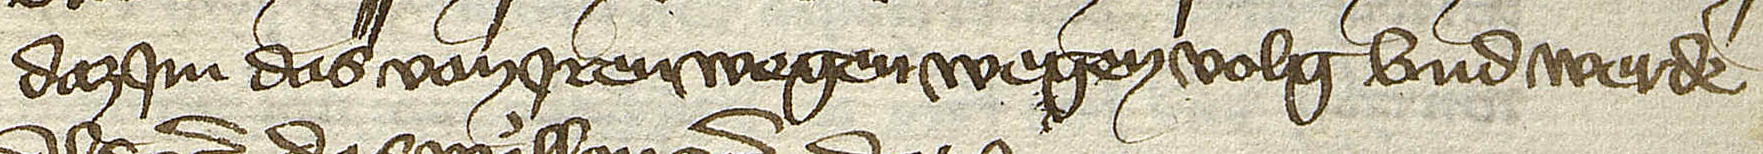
daʒ Im das von Iren wegen wegen volg vnd werde
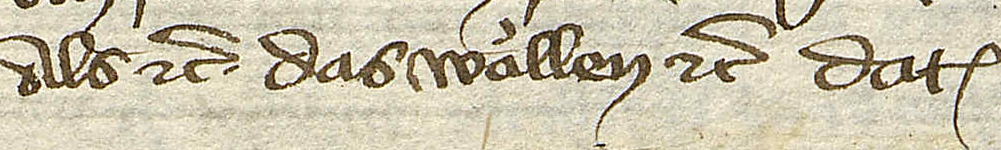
Als ec* . das wöllen ec* Dat*
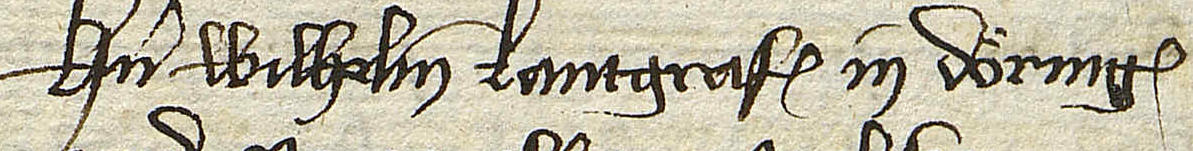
H*n Wilhelm* lantgraf* in Döring*
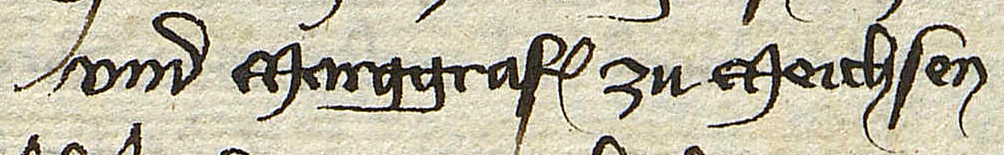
vnd Marggraf* ʒu Meichſen
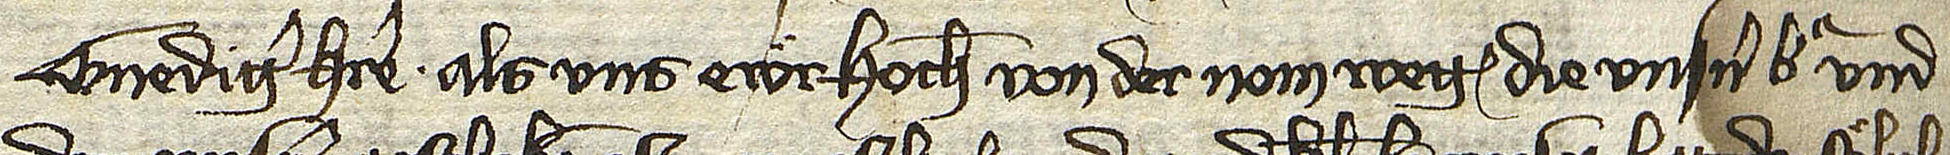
Gnedig* h*re . als vns ewr Hoch* von der nom weg* die vnſ*n b* vnd
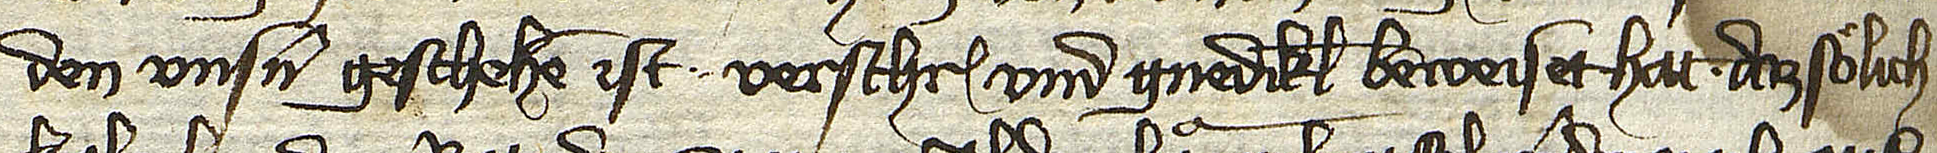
den vnſ*n geſchehe* iſt . verſchr* vnd gnedikl* beweiſet hat . daʒ ſölich
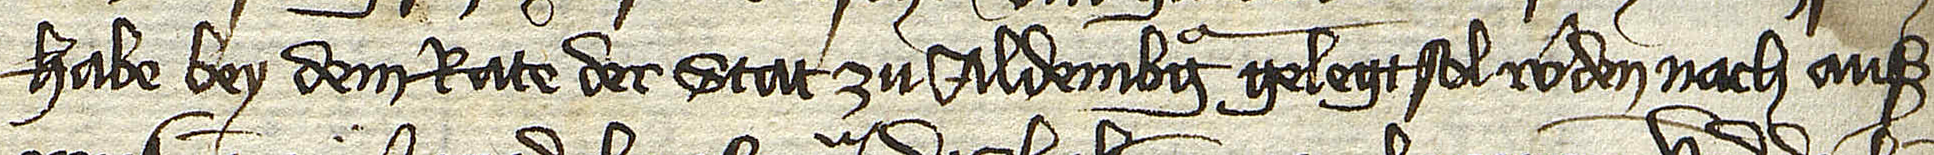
habe bey dem Rate der Stat ʒu Aldemb*g gelegt ſol w*den nach auſʒ
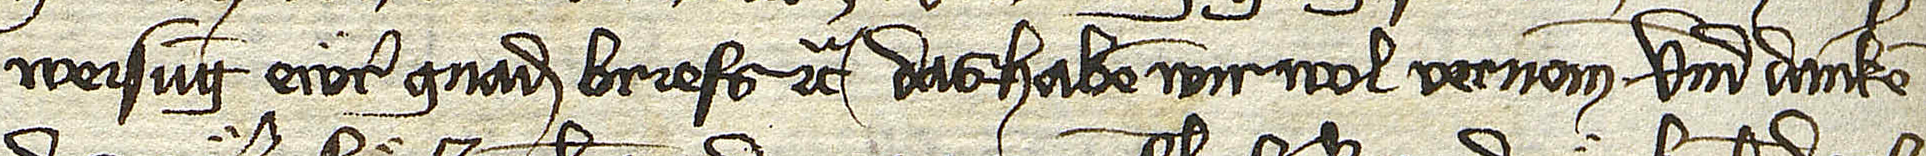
weiſu*g ew*r gnad* briefs ec* das habe* wir wol vernom* Vnd danke*
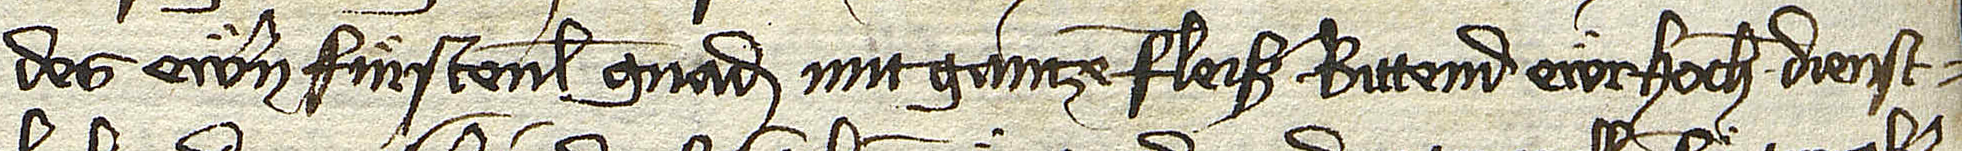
des ew*n fürſtenl* gnad* mit gancʒe* fleiſʒ . Bittend ewr hoch* dienſt =
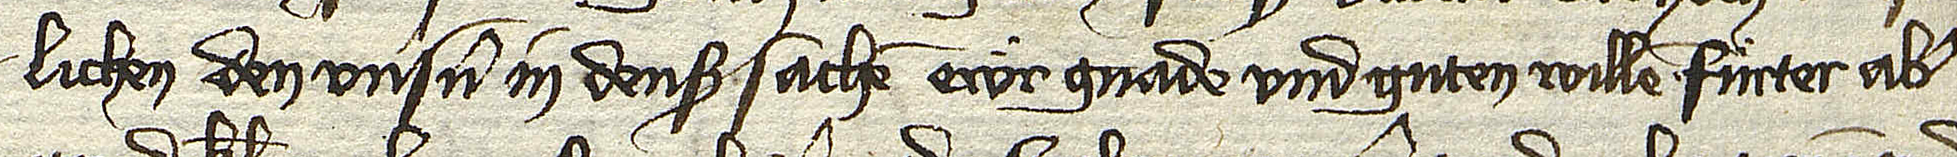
lichen den vnſ*n in denſ* ſache* ewr gnade vnd guten wille* . fürter ab*
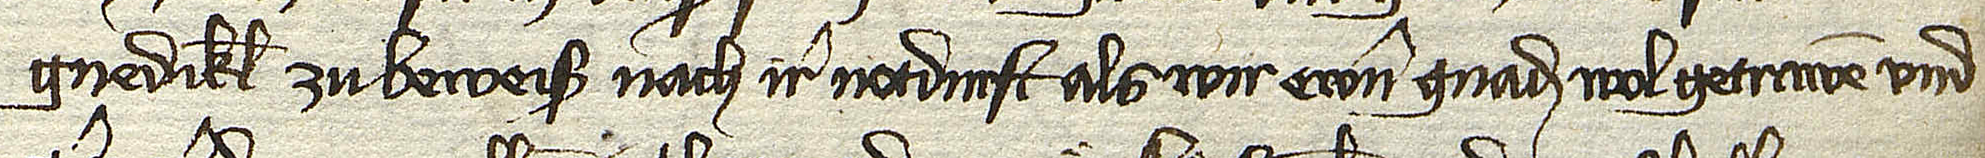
gnedikl* ʒu beweiſ* nach ir* notdurft als wir ew*n gnad* wol getrawe* vnd
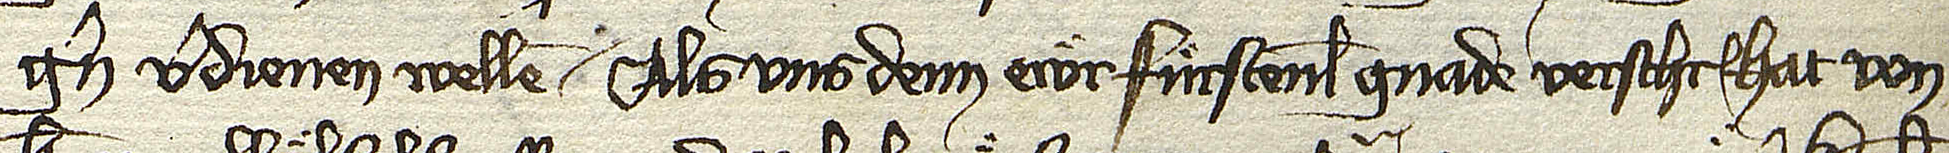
g*n v*dienen welle* / Als vns denn ewr fürſtenl* gnade verſchr* hat von
